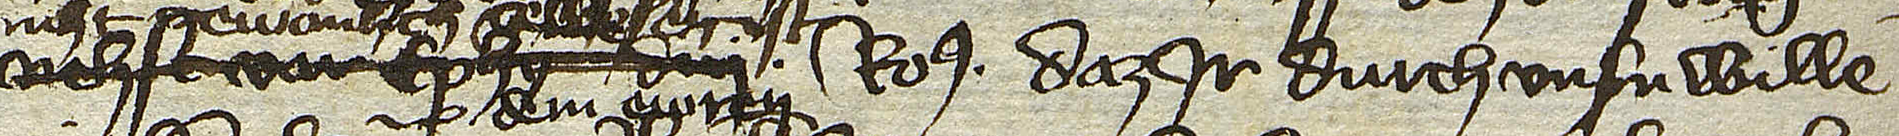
nehſt vor Ephy* dni* . Ro* . daʒ Ir durch vnſ*n wille*
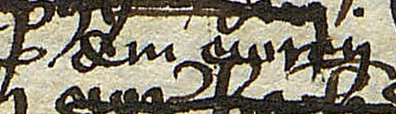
dem ewren
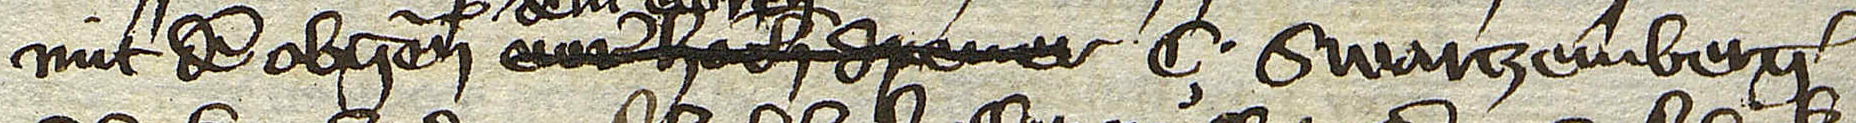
mit de* obgen* ewr* hoch* dyener C . Swarcʒemberg*
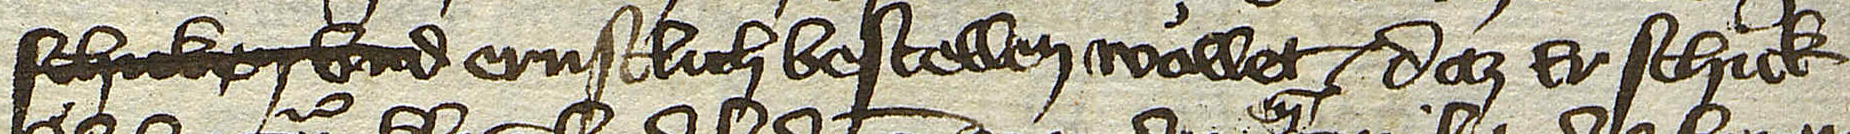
ſchicken vnd ernſtlich beſtellen wöllet / daʒ Er ſchick
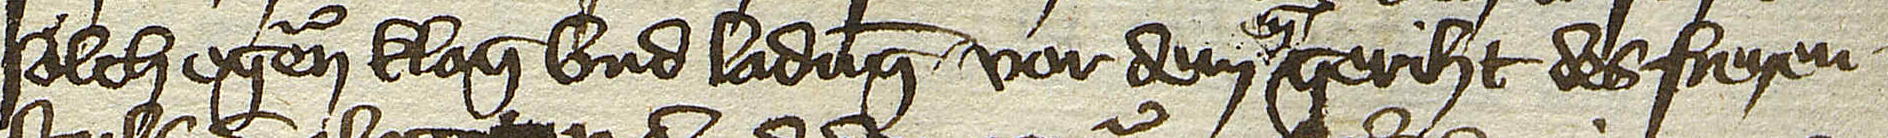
ſölch egen* klag* vnd ladu*g vor dem geriht des freyen -
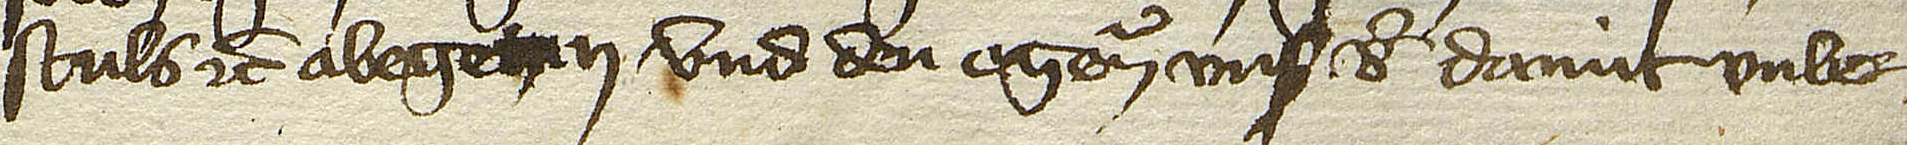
ſtuls ec* abegen / Vnd den egen* vnſ* B* damit vnbe =
